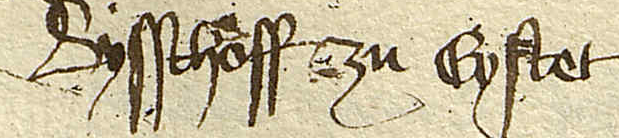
Byſſchoff cʒu Eyſtet
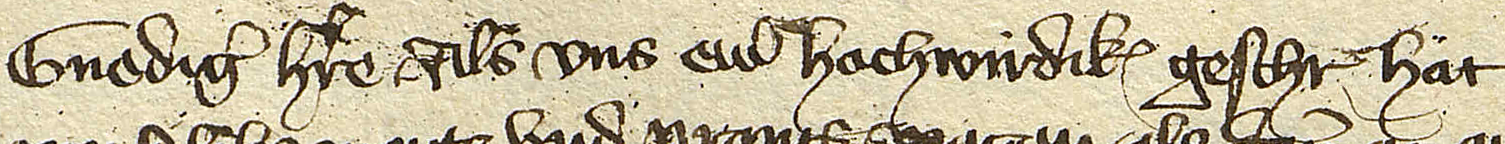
Gnedig* h*re / Als vns ew* hochwirdik* geſchr* hat
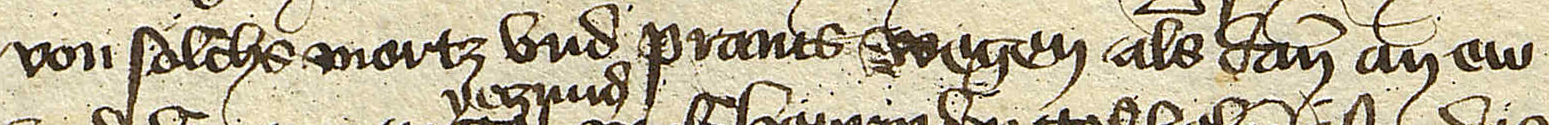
von ſölchs mortʒ vnd prants wegen / als dan* an ew
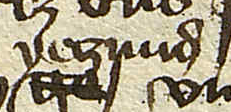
yecʒund*
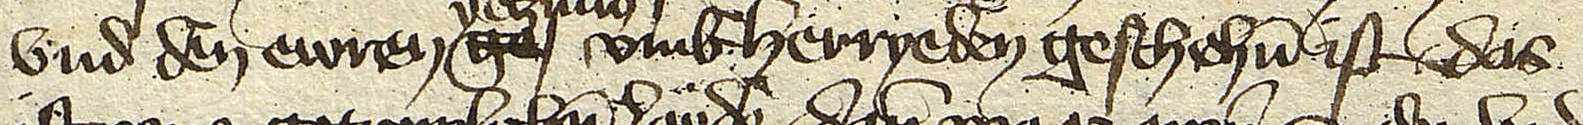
vnd den ewren ge vmb herryeden geſchehn* iſt / das
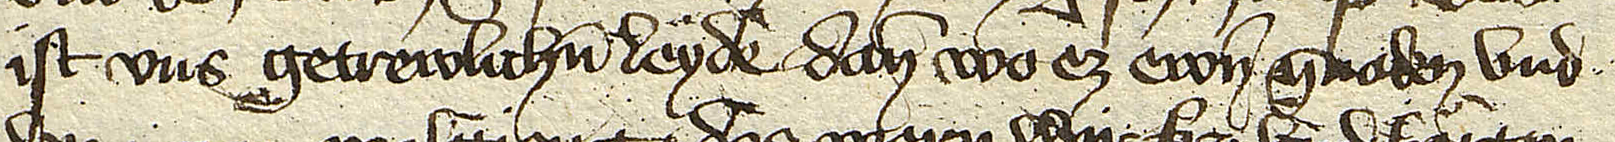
iſt vns getrewlichn* leyde dan* wo eʒ ewn* gnaden vnd
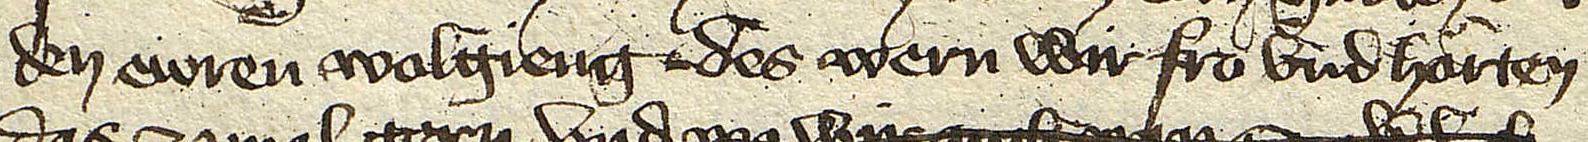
den ewren wolgieng / des wern wir fro vnd hörten
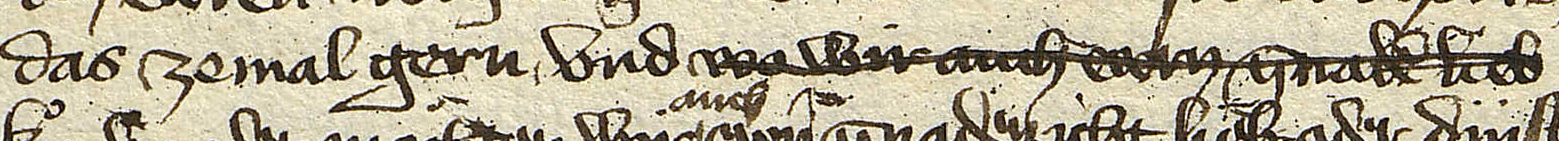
das cʒemal gern / vnd wo wir auch ewrn gnade* lieb
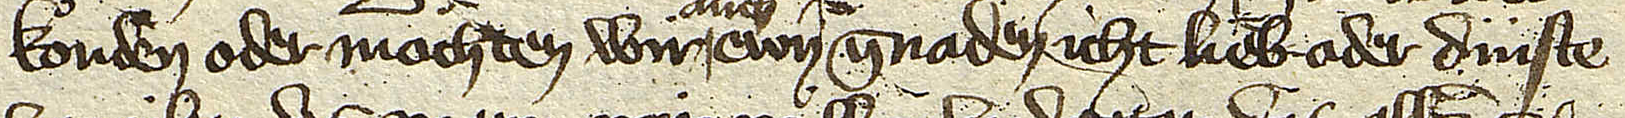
könden oder möchten wir ewn* gnaden icht lieb oder dinſte
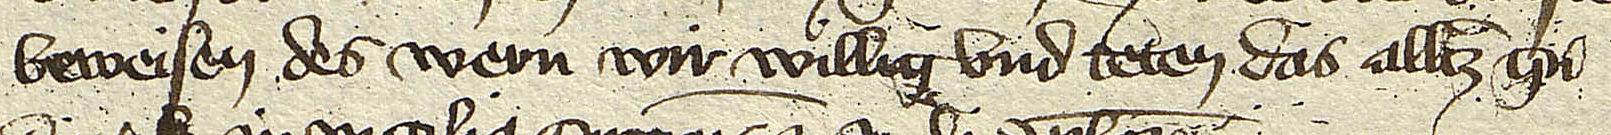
beweiſen des wern wir willig vnd teten das allcʒ* gn*
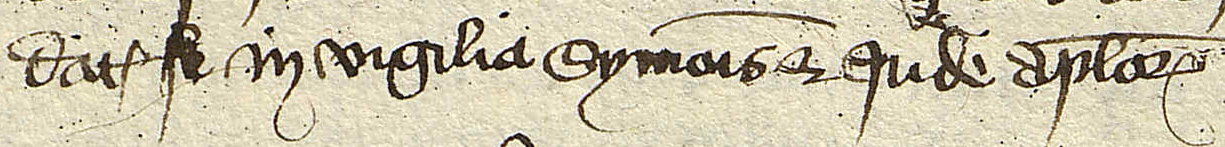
dat* fe in vigilia Symois* @ Iude Aplo*
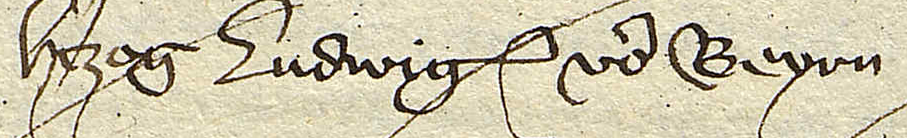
h*cʒog Ludwig* vo* Beyrn
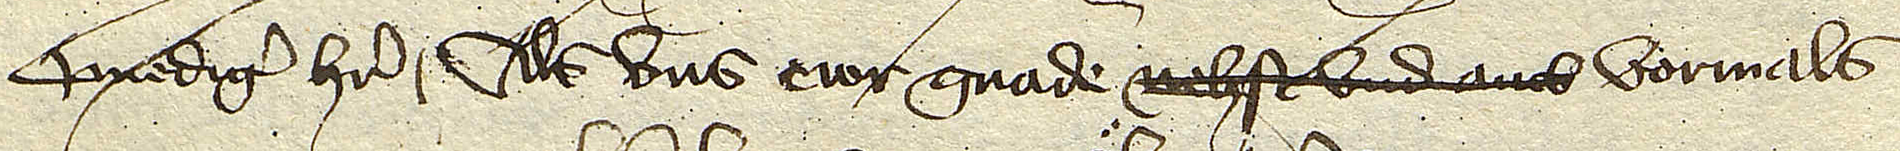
Gnedig* hr* / Als vns ewr gnade nehſt vnd auch vormals
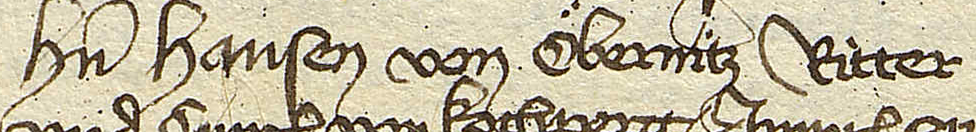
hn* hanſen von Öbernicʒ Ritter
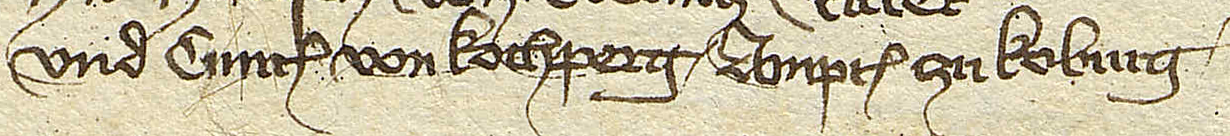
vnd Cunr* von Kochperg / Ampt* cʒu Koburg*
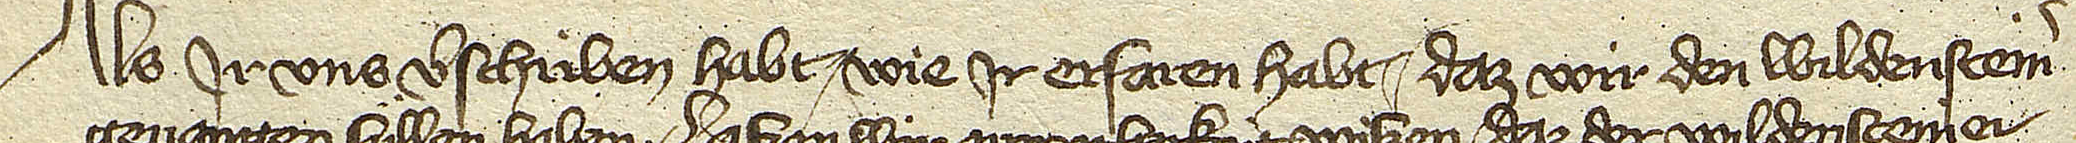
Als Ir vns v*ſchriben habt / wie Ir erfaren habt / daʒ wir den wildenſtein*
